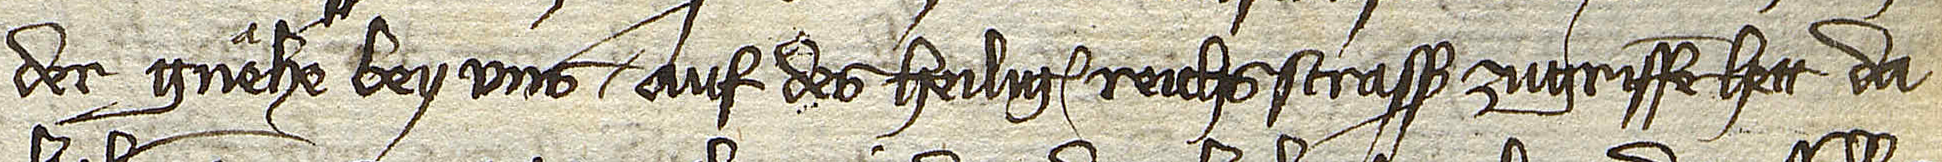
der gnëhe bey vns / auf des heilig* reichsſtraſſ* ʒugriffe* hett da
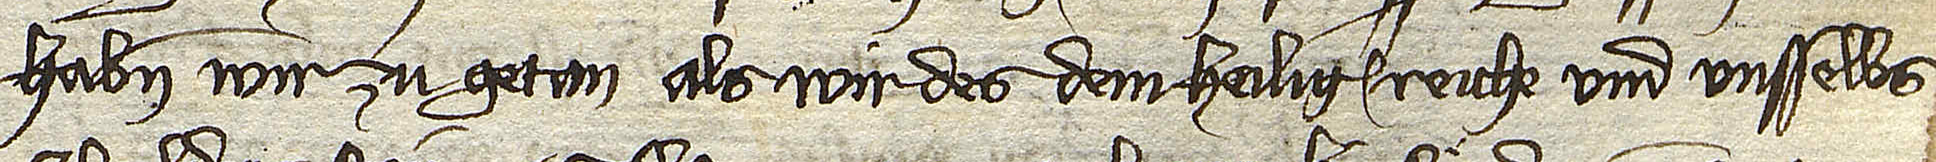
habn* wir ʒu getan als wir des dem heilig* reiche vns vnſſelbs
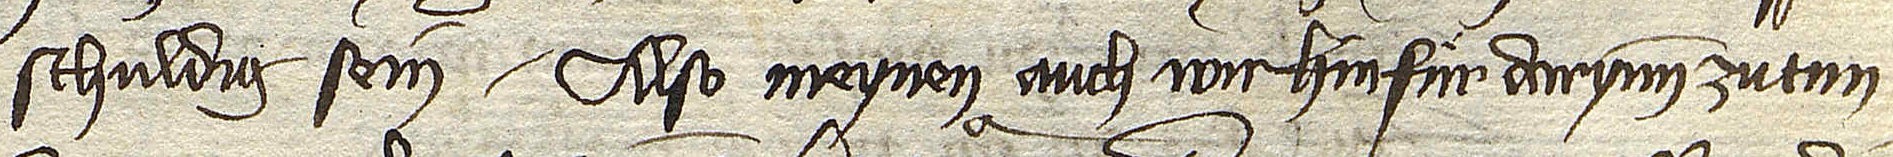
ſchuldig ſein / Alſo meynen auch wir hin für darynn* ʒutun
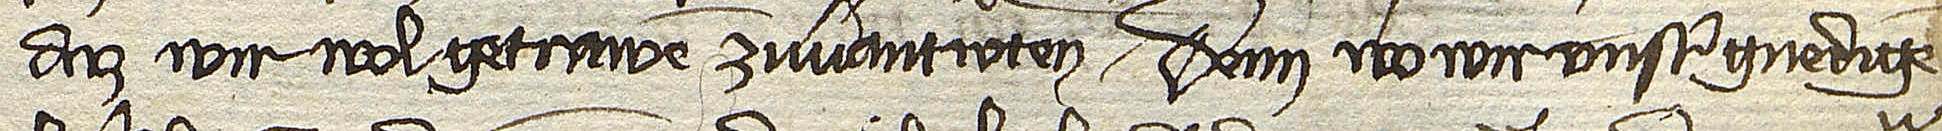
daʒ wir wol getrawe* ʒuu*antw*ten / Denn wo wir vnſr* gnedige*
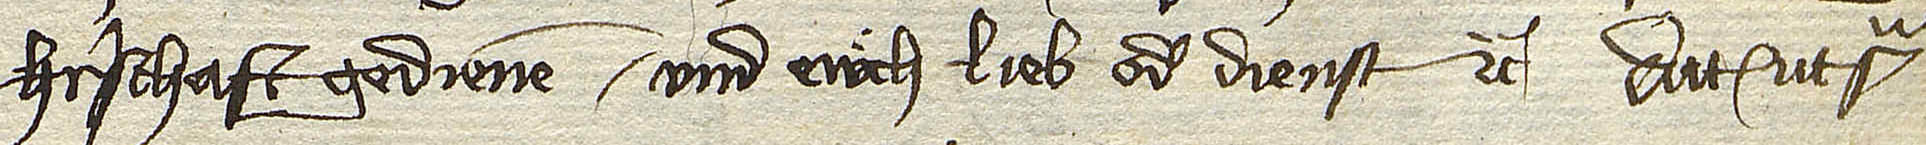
hr*ſchaft gediene* / vnd eẅch lieb od* dienſt ec* Dat* ut ſ*
